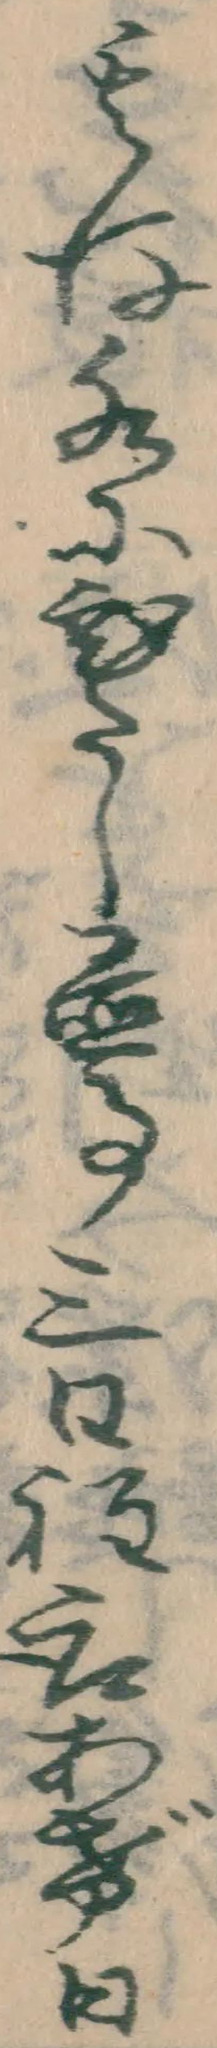その後水にひたし置事三日程取あげ日
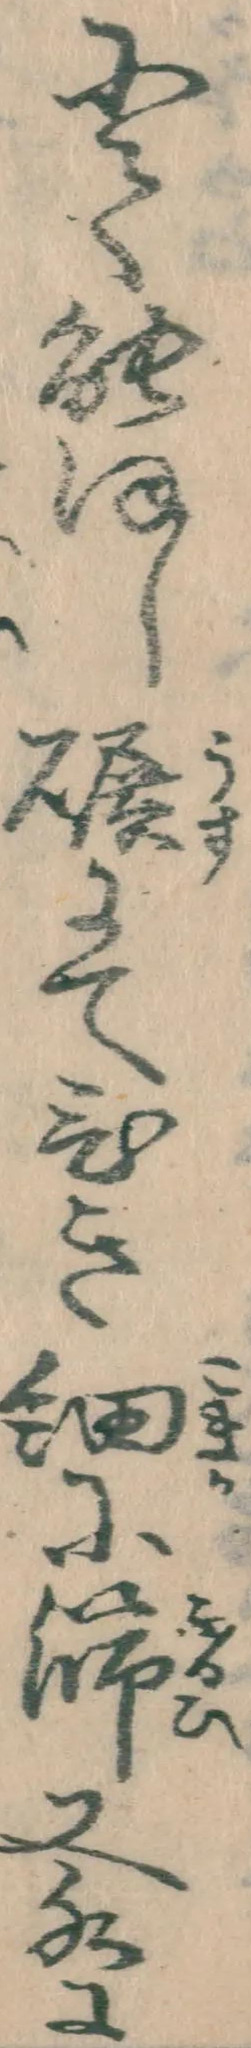にて能ほし碾にてひき細に篩又水に
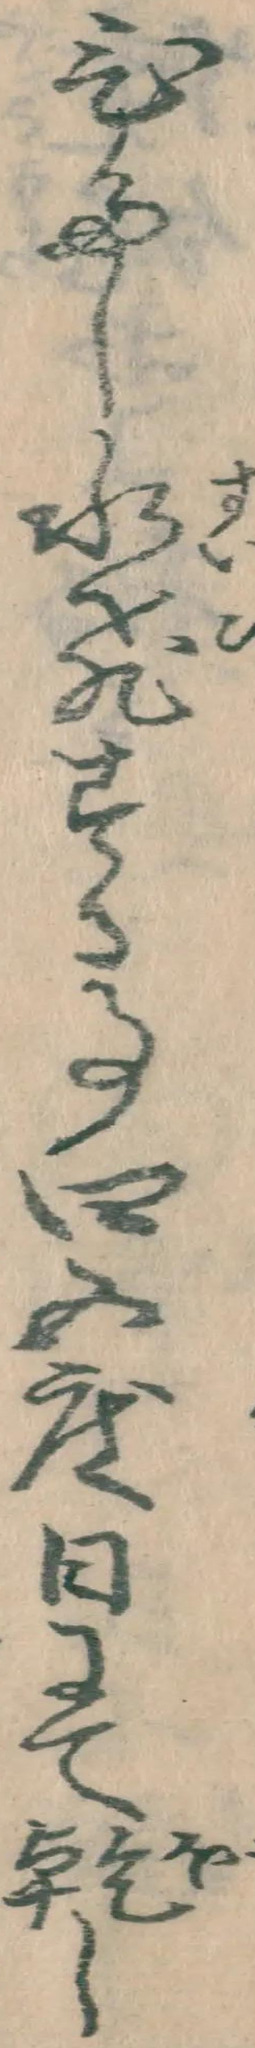ひたし水飛する事四五度日にて乾し
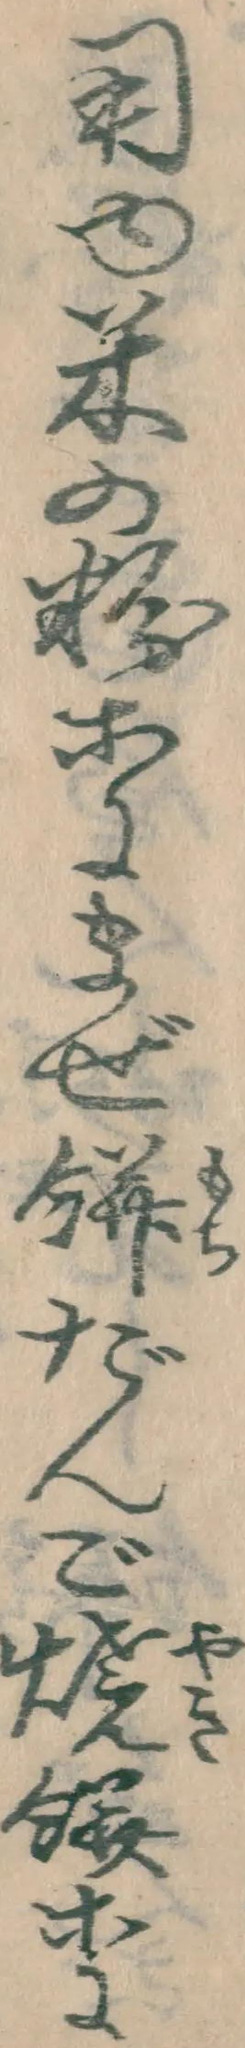用ゆ米の粉等にまぜ餅だんご焼餅等に
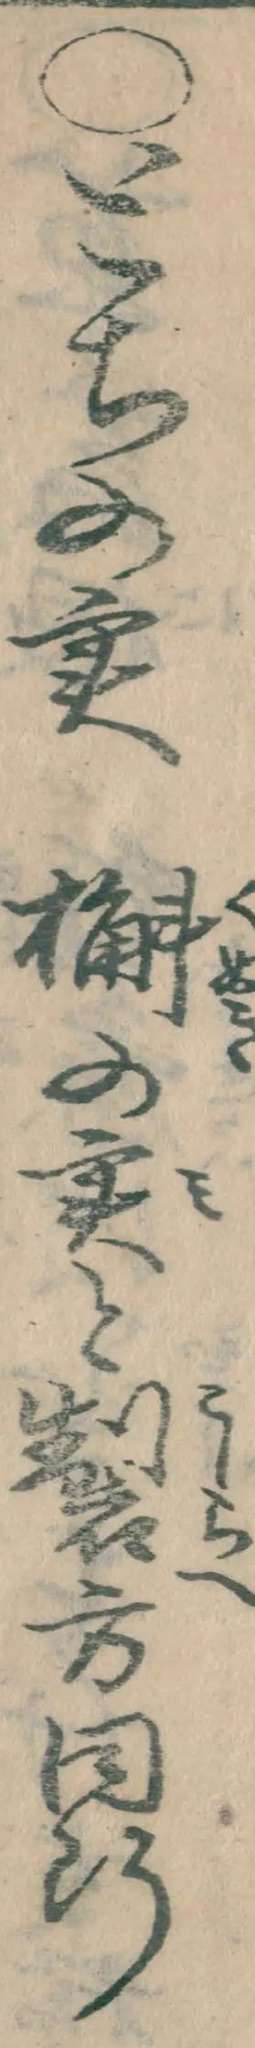〇とちの実檞の実と製方同断

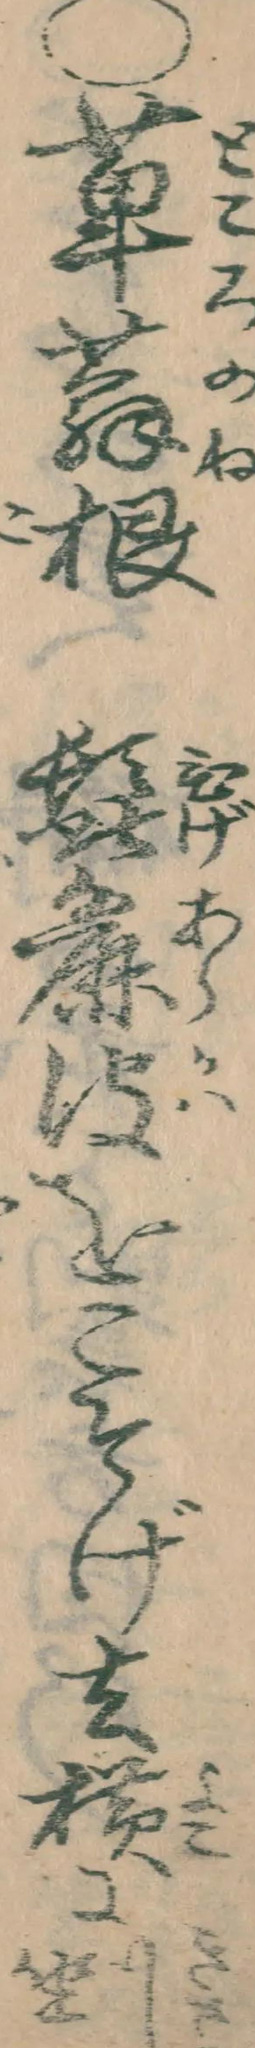〇萆蒻根髭麁皮をこそげ去横に剉
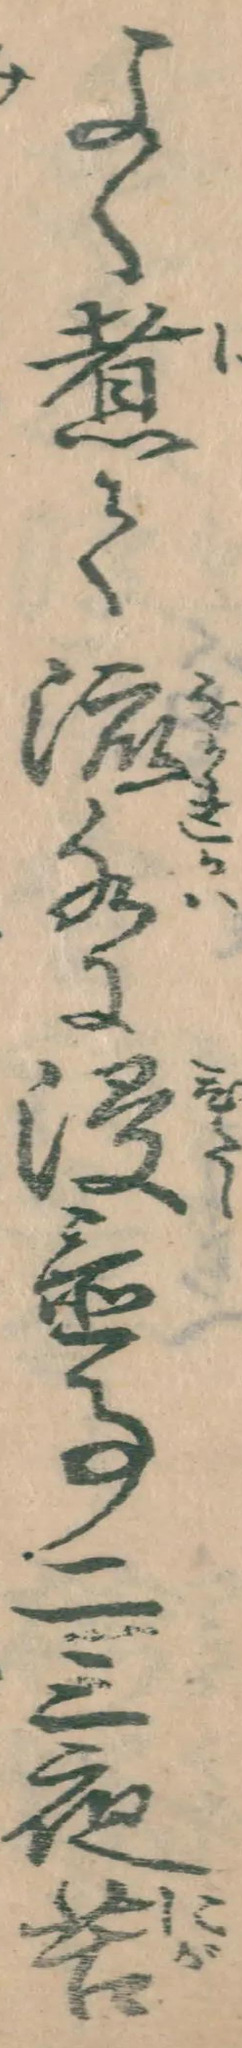よく煮て流水に浸置事二三夜苦
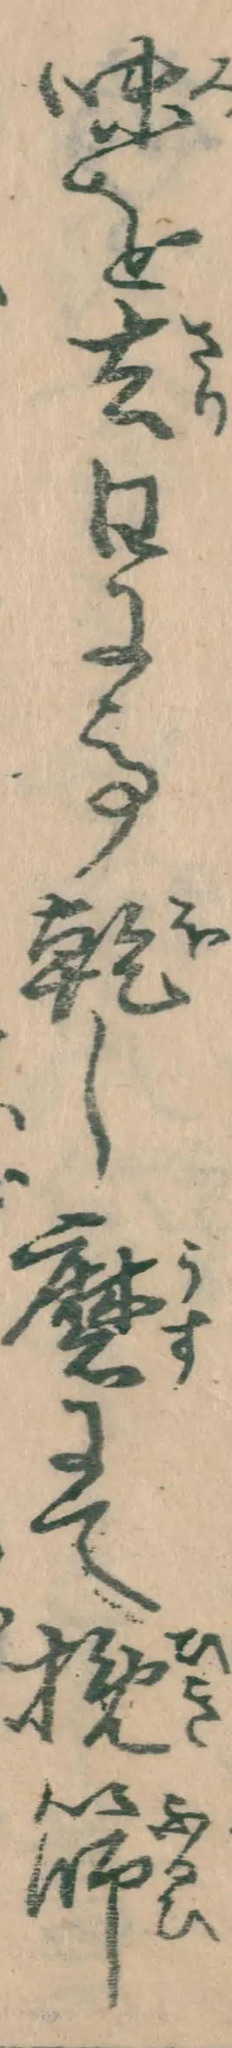味を去日にて乾し磨にて挽篩
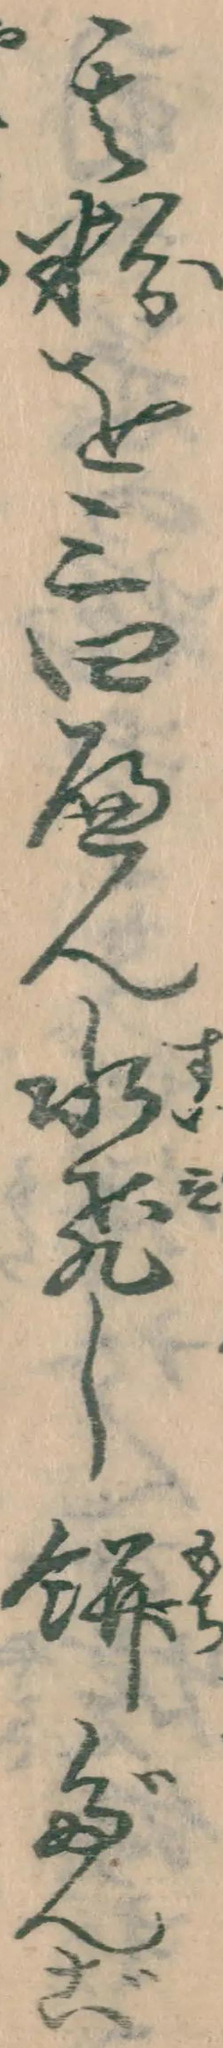その粉を三四扁ん水飛し餅だんご
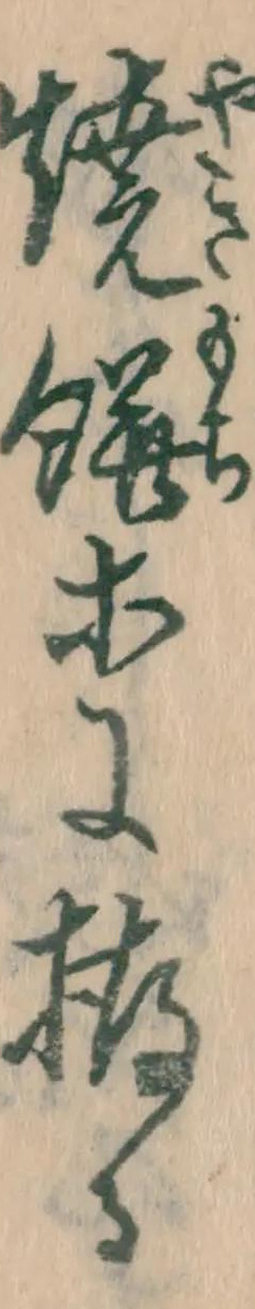焼餅等に拵る
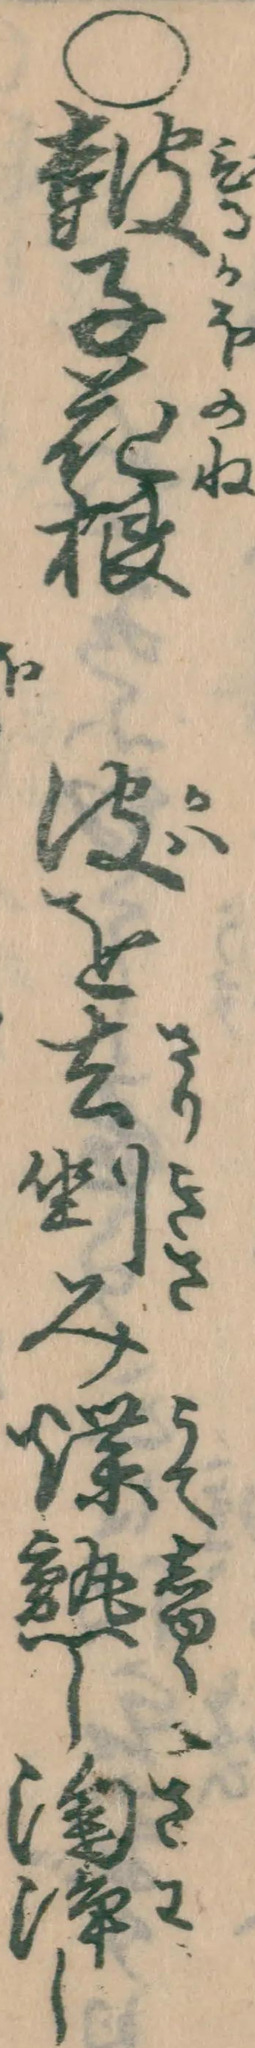〇鼓子花根皮を去剉み爛熟し淘浄し
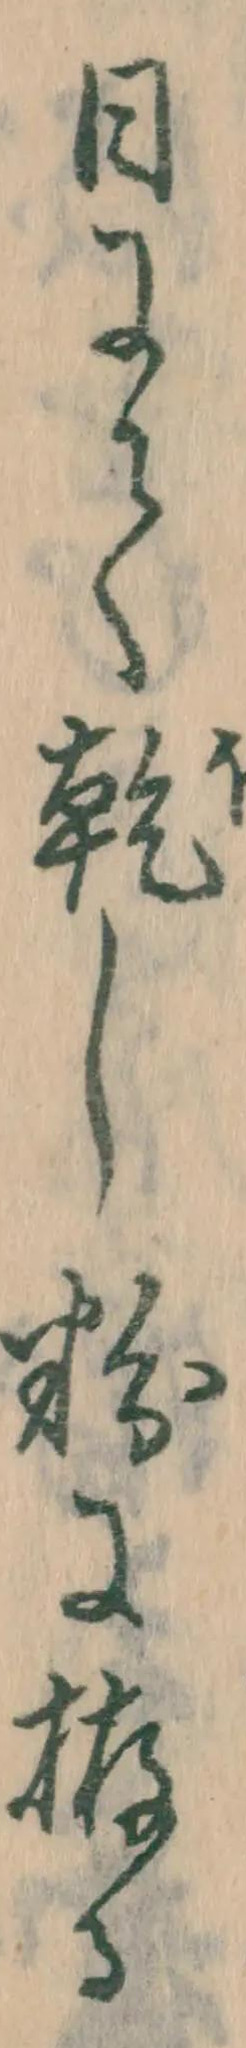日にて乾し粉に拵る
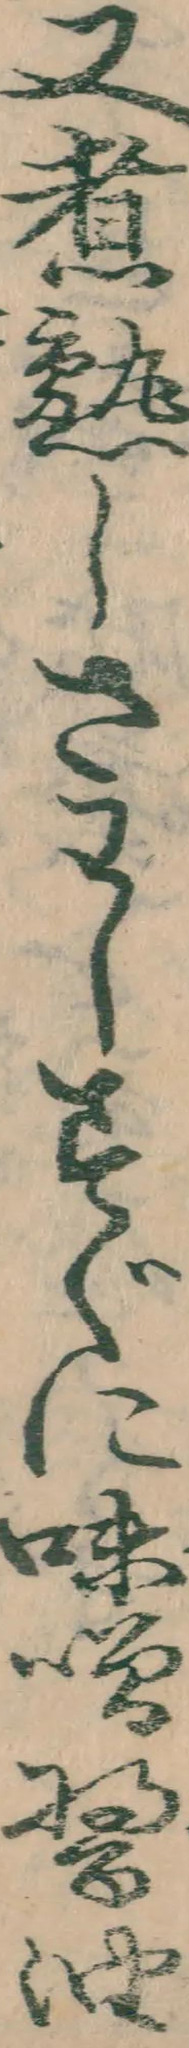又煮熟しさわしすぐに味噌醤油
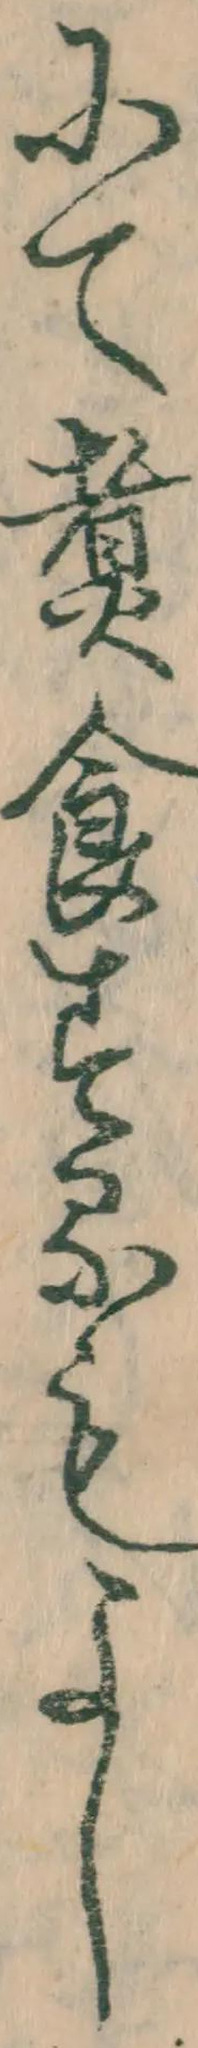にて煮食するもよし
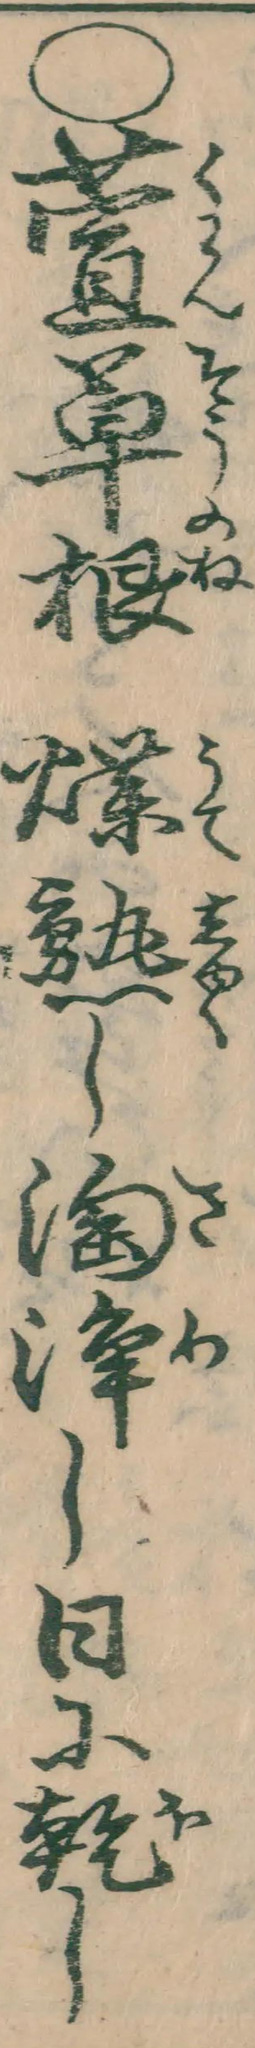〇萱草根爛熟し淘浄し日に乾し
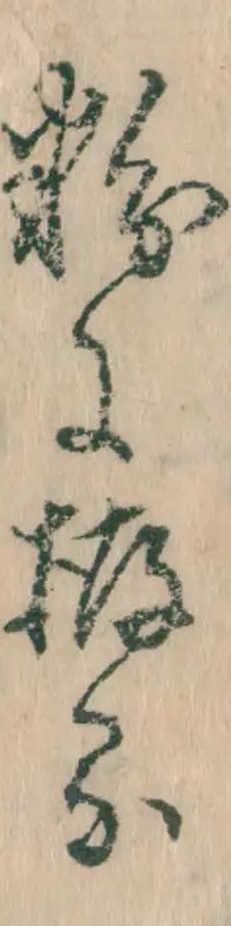粉に拵る
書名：救荒鄙諭
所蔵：国立国会図書館 National Diet Library, JAPAN
